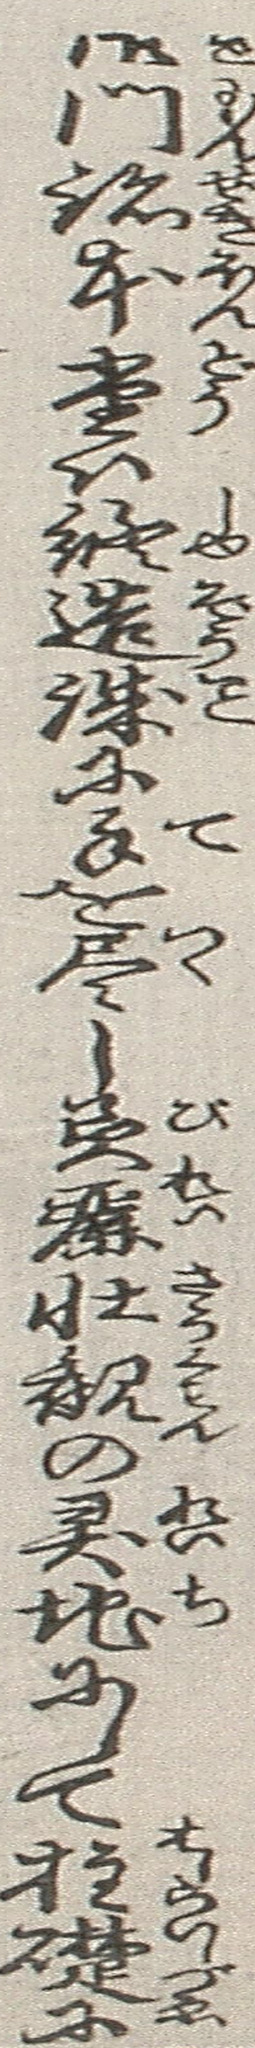御門跡本堂ハ終造殊に手を尽し美麗壮観の霊地にて柱礎に
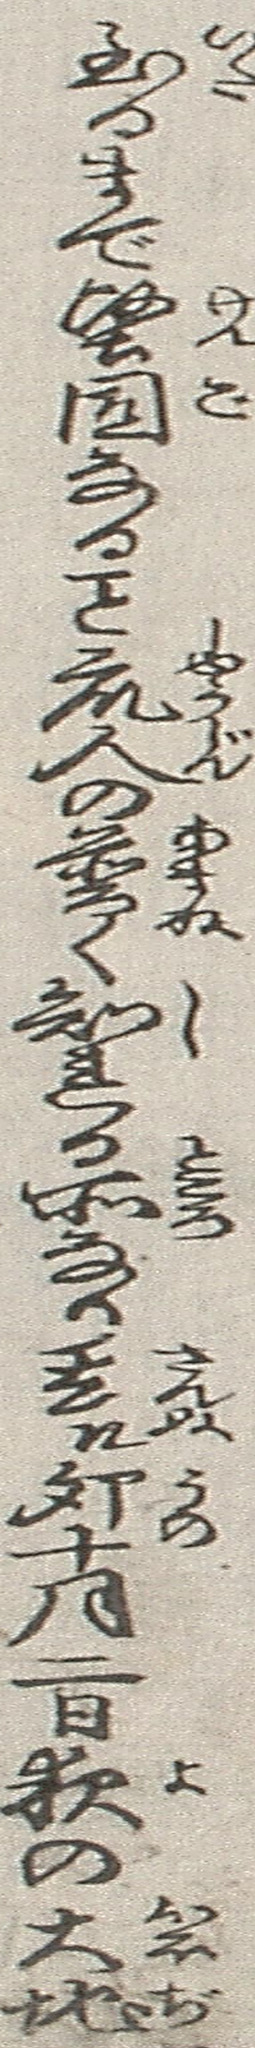至るまで堅固なること衆人の普く知れる所なり去ㇽ卯十月二日夜の大地
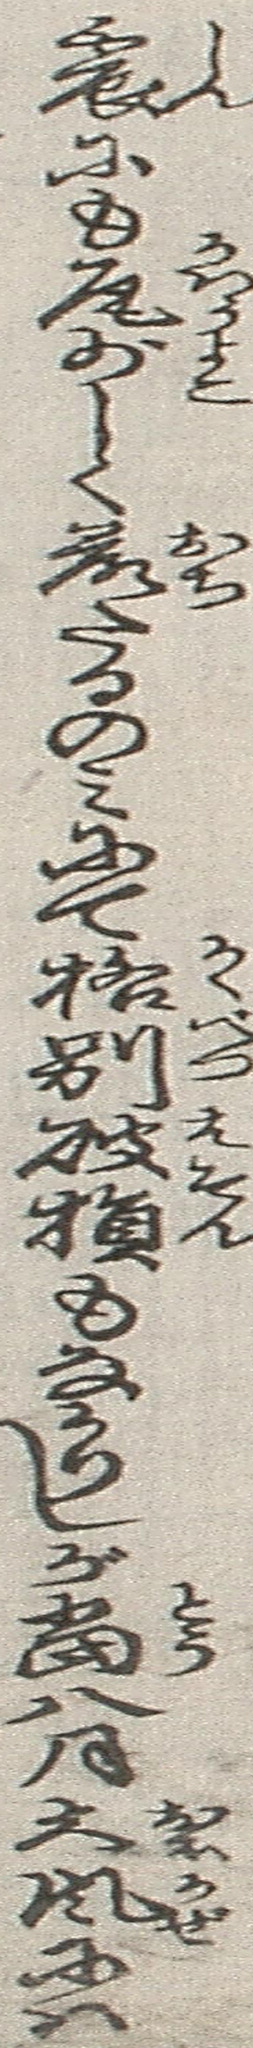震にも瓦少しく落たるのミにて格別破損もなかりしが当八月大風にハ
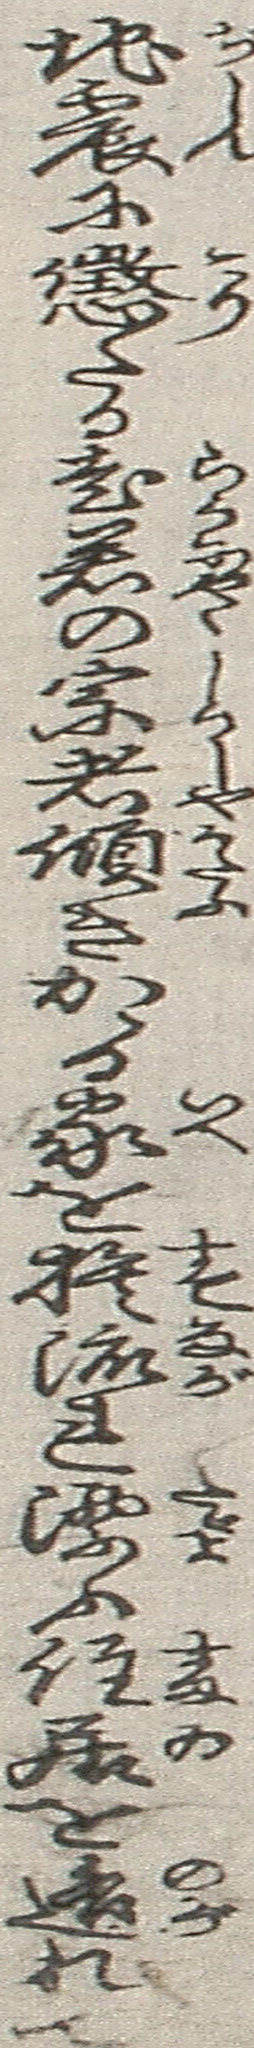地震に懲たる老若の宗者傾きかゝる家を捨流れ漂ふ住居を遁れて
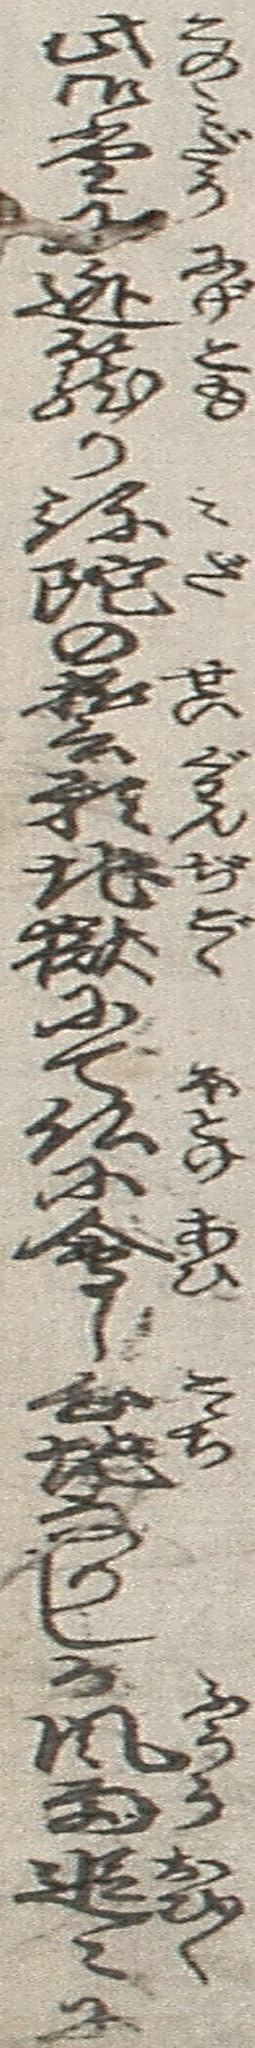此御堂に逃籠り弥陀の誓願地獄にて仏に会し心地なりしか風雨追々に
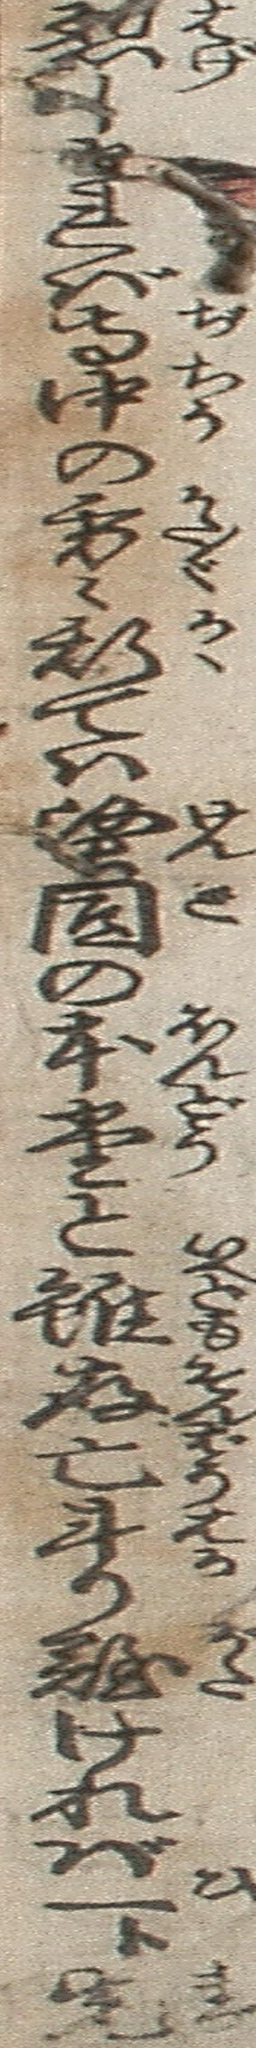烈しけれバ寺中の方々斯てハ堅固の本堂と雖存亡斗り難けれバ一ト先

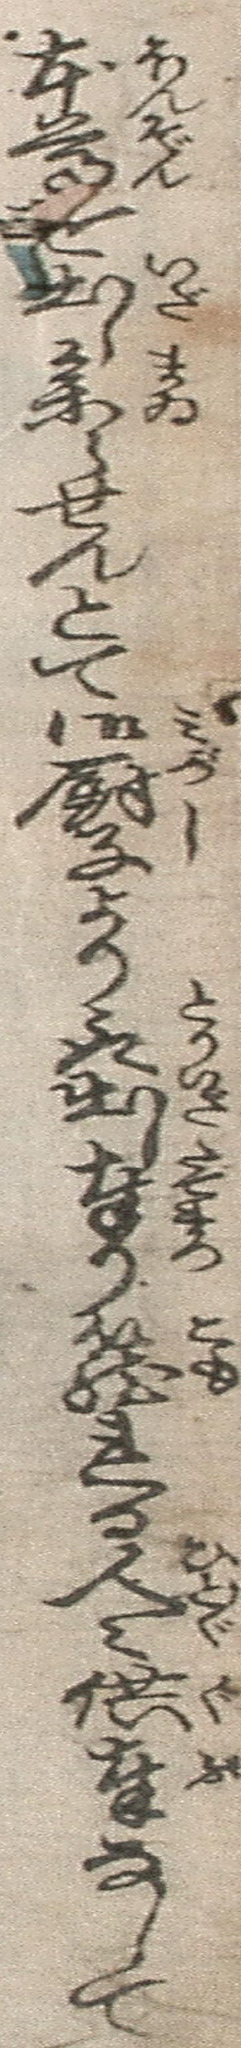本尊を出し参らせんとて御厨子より取出し奉り籠れる人々供奉なして
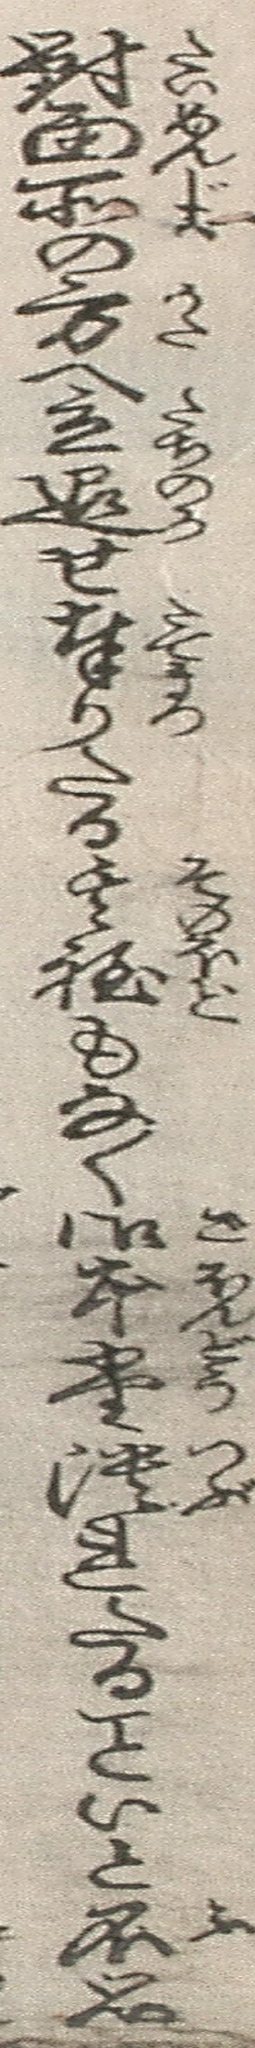対面所の方へ立退せ奉りたる其程もなく御本堂潰れたることいと不思
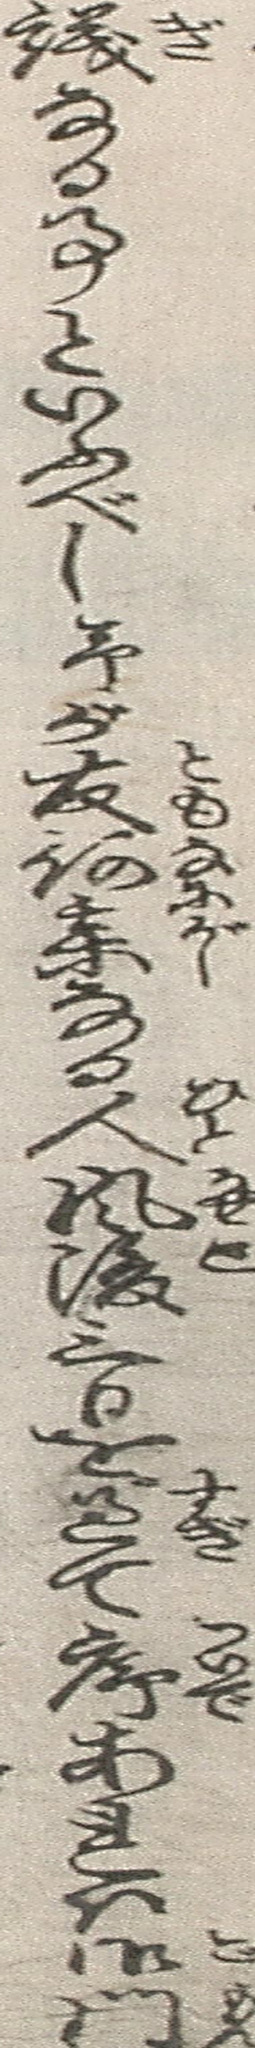議なる事といふべし予が友何某なる人風後三日を過て序あれハ御門
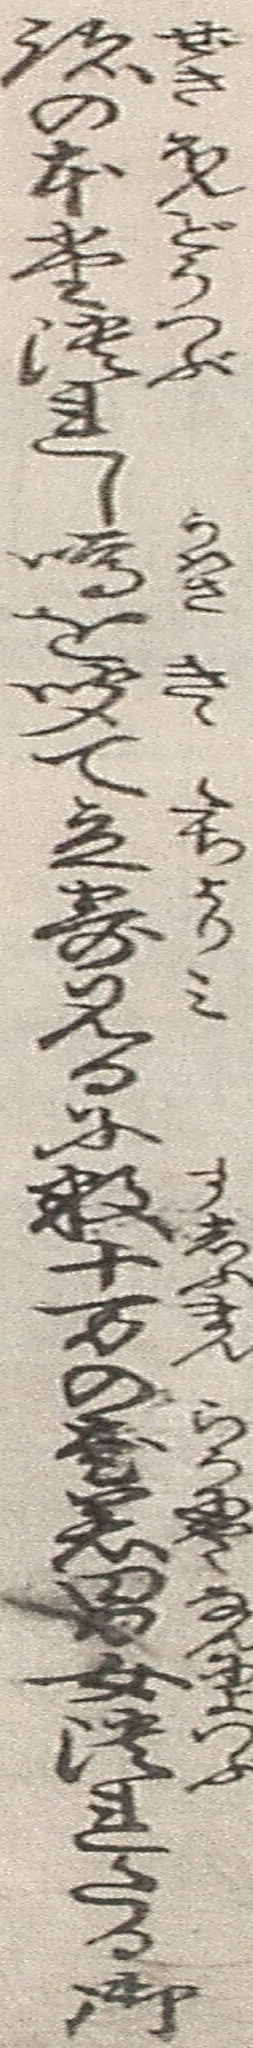跡の本堂潰れし噂を聞て立寄見るに数十万の老若男女潰れたる御
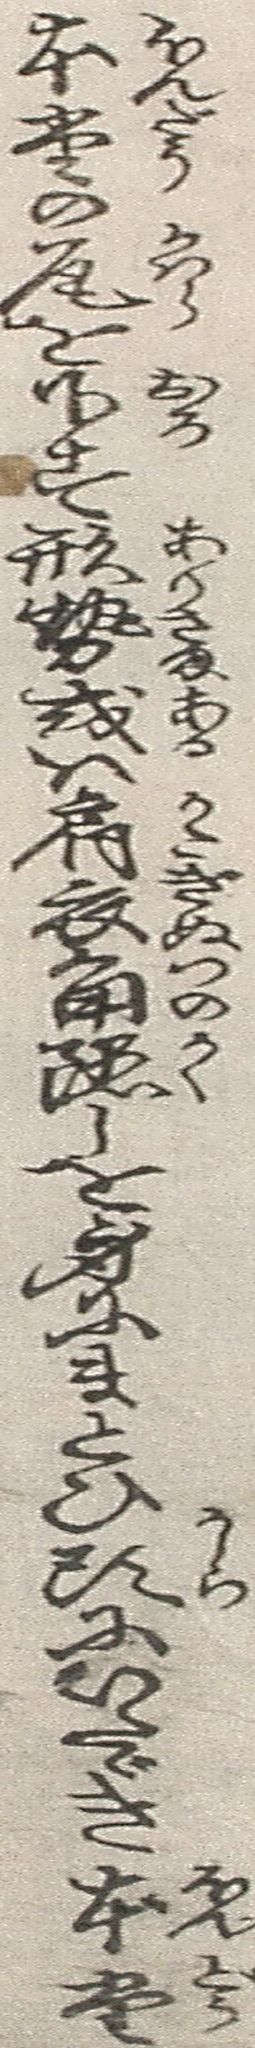本堂の瓦を下す形勢或いハ肩衣角隠しを身にまとひ頭にいたゞき本堂
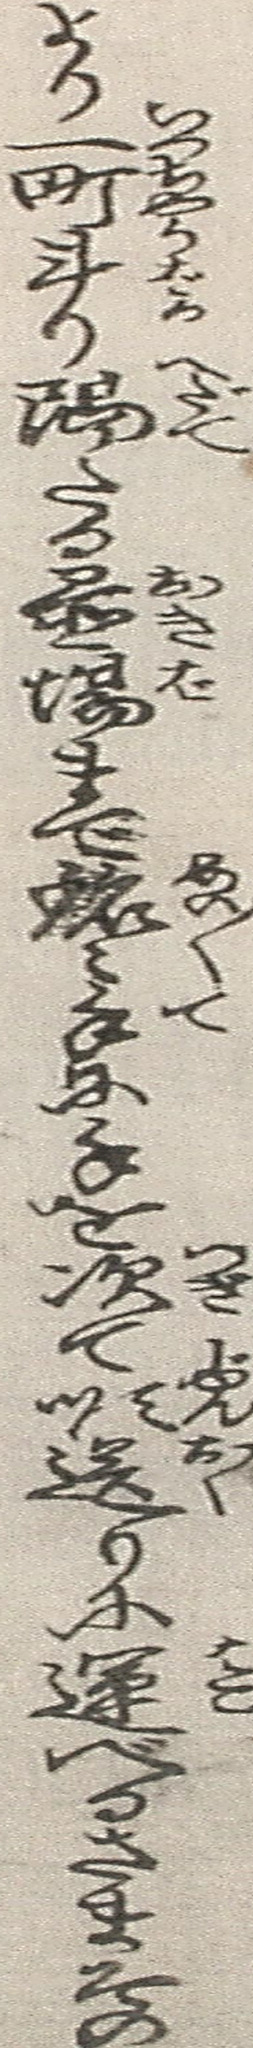より一町斗り隔たる置場まで銘々手に手を次て順送りに運べるさまその
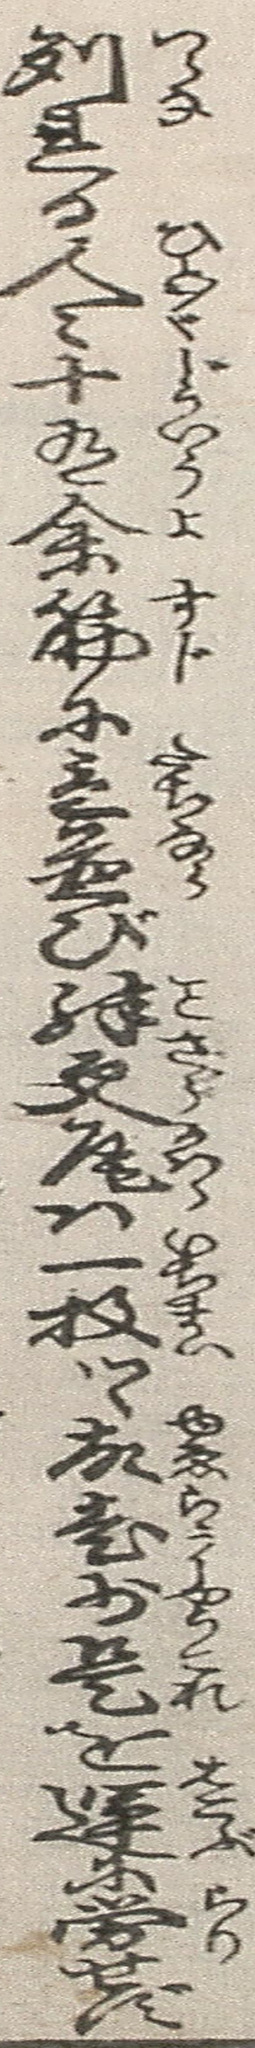列れる人々十有余筋に立並び殊更瓦ハ一枚ッゝ故老少是を運ふに労せず
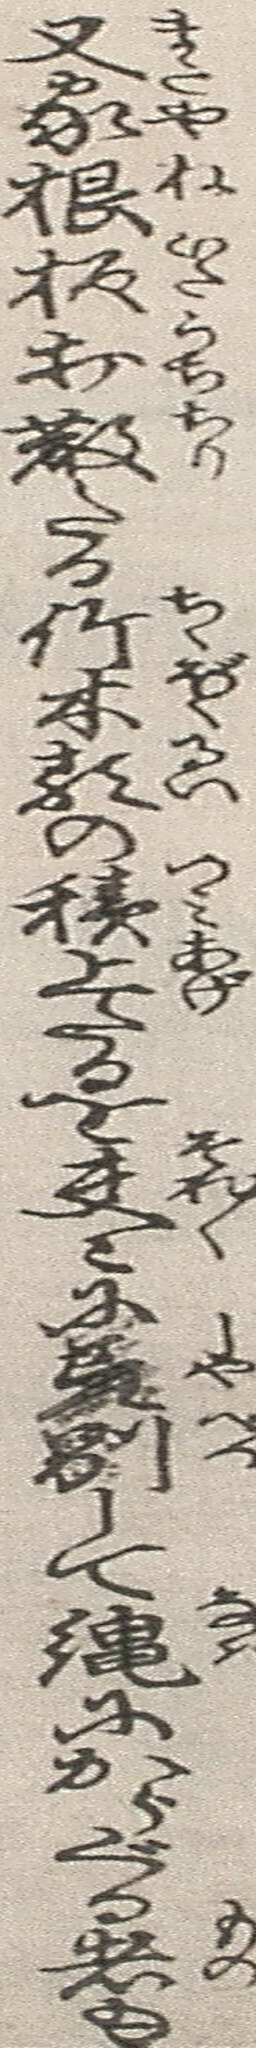又家根板打散たる竹木類の積上たるを夫々に差別して縄にからぐる者も
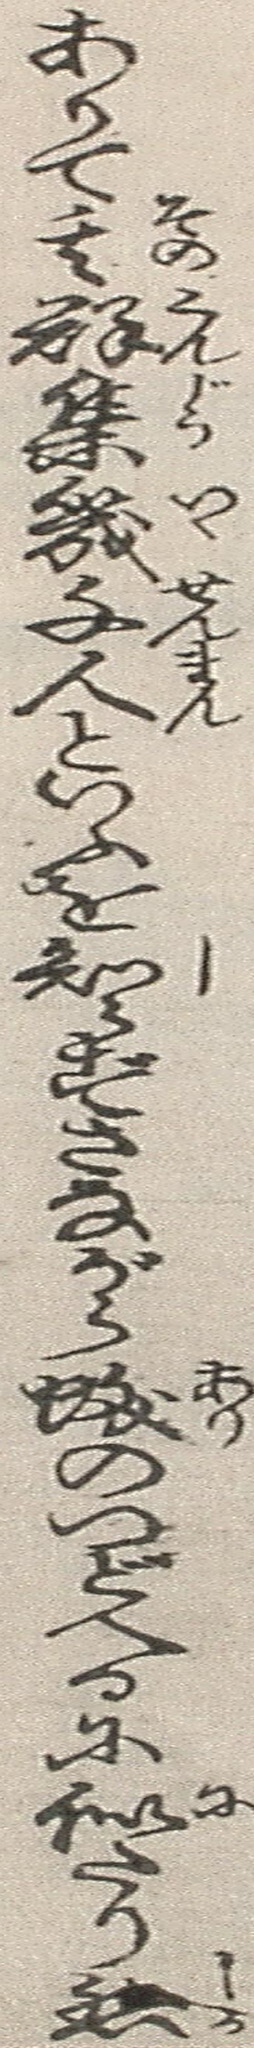ありて其群衆幾千人といふを知らずさながら蟻のつどへるに似たり然
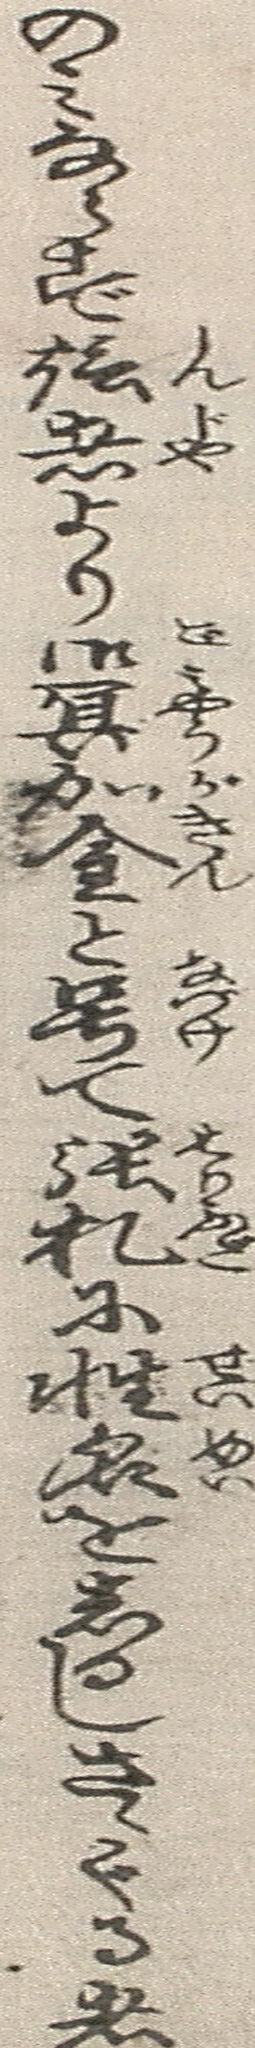のミならず信者より御冥加金と号て張札に姓名をするしさゝぐる者
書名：安政風聞集　上中下　全
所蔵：東京大学地震研究所図書室 Earthquake Research Institute Library, The University of Tokyo, JAPAN
